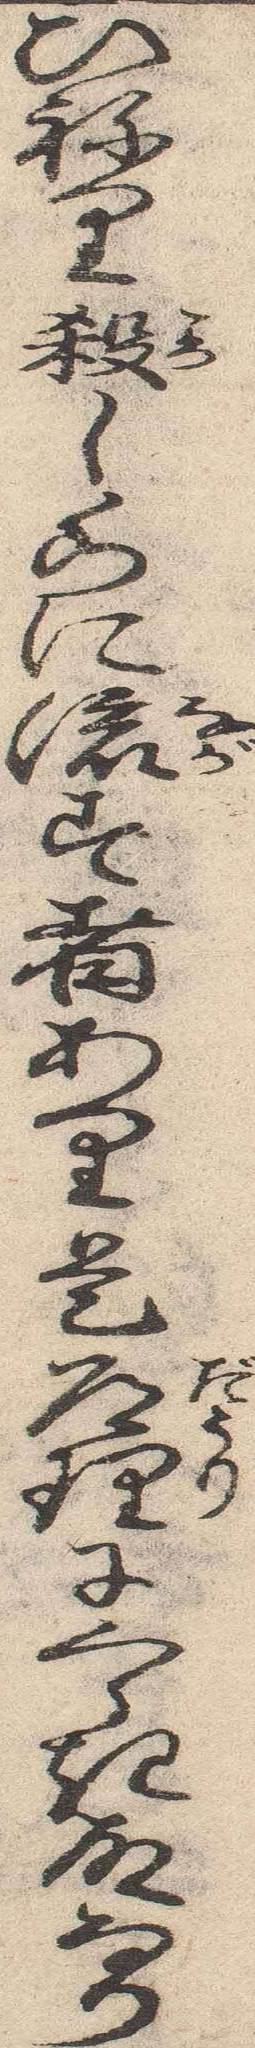ひねり殺し水に流す者あり是道理にくらき故なり
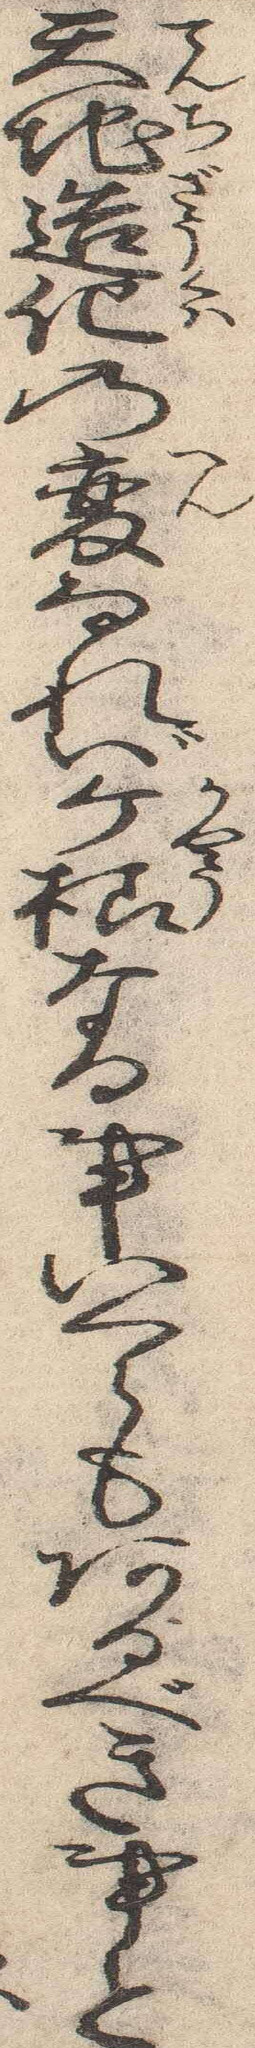天地造化の変なればケ様なる事いくらもあるべき事と
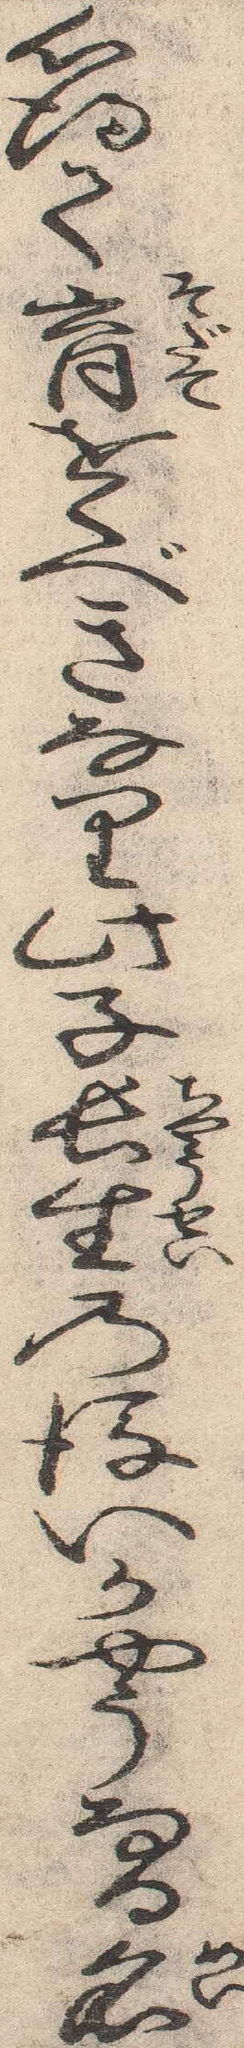心得て育をくべきなり此子長生の後いかやうなる名
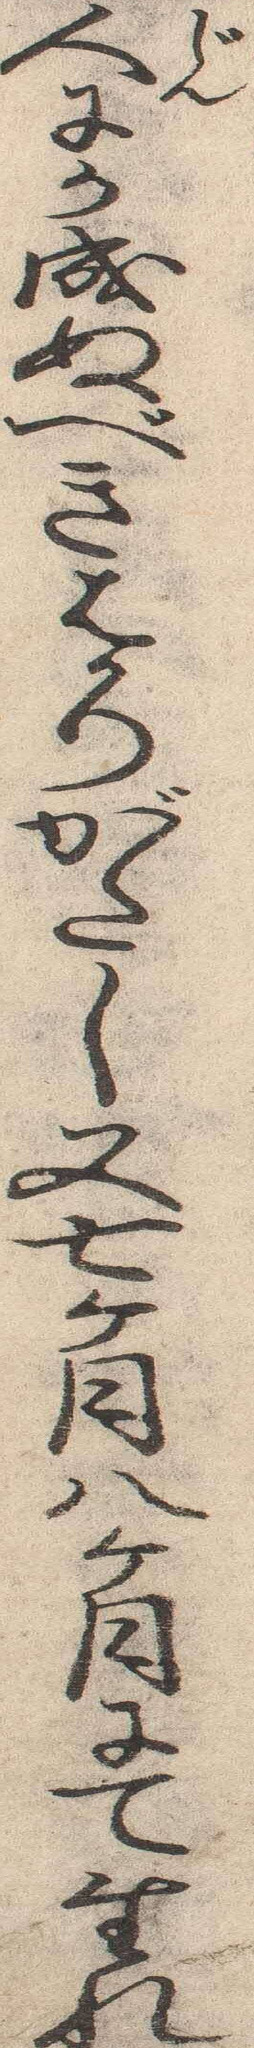人にか成ぬべきはかりがたし又七ヶ月八ヶ月にて生れ
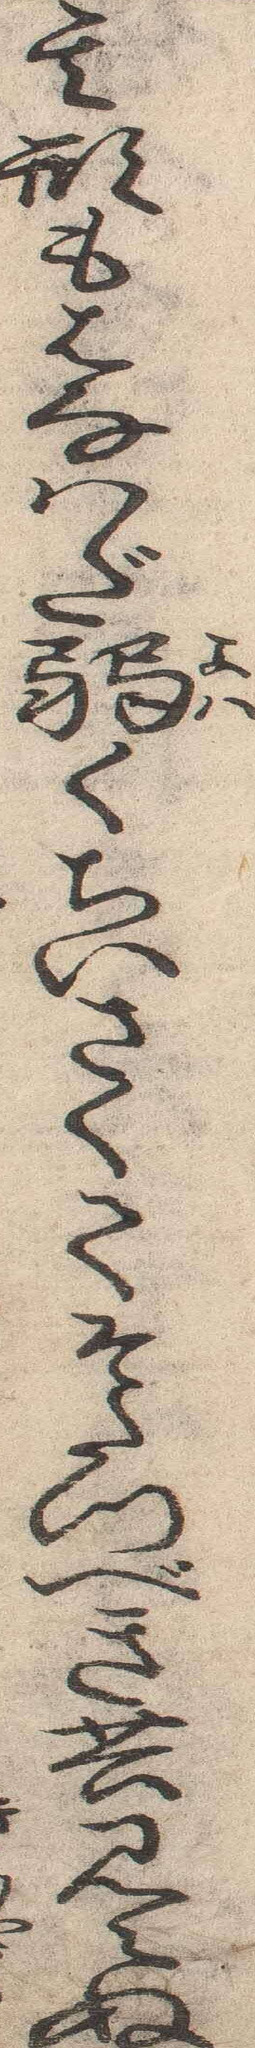其形もはなはだ弱くちいさくてそたつべき共見えぬ
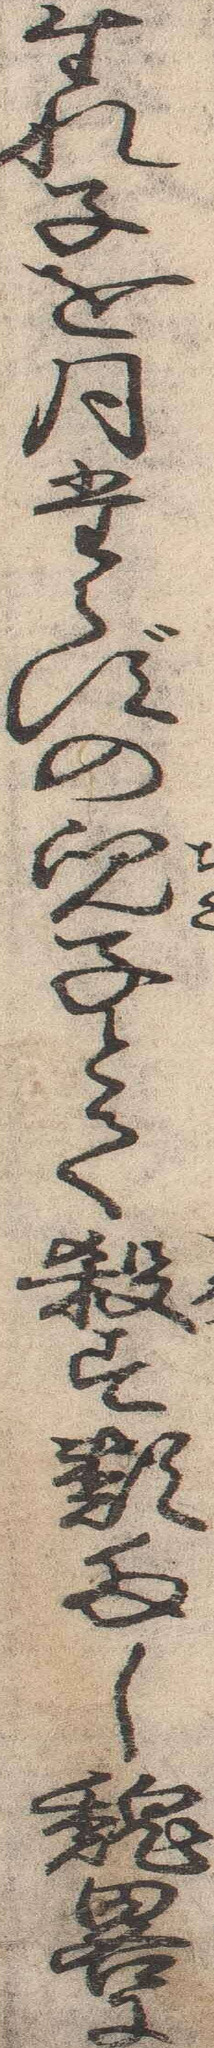生れ子を月たらずの児子とて殺す類多し魏畧に

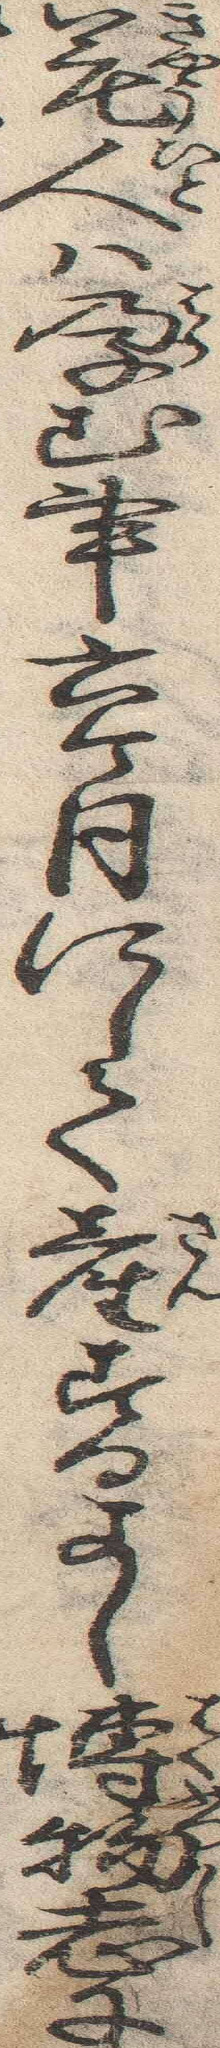姜人は孕む事六ヶ月にして産するよし博物志に
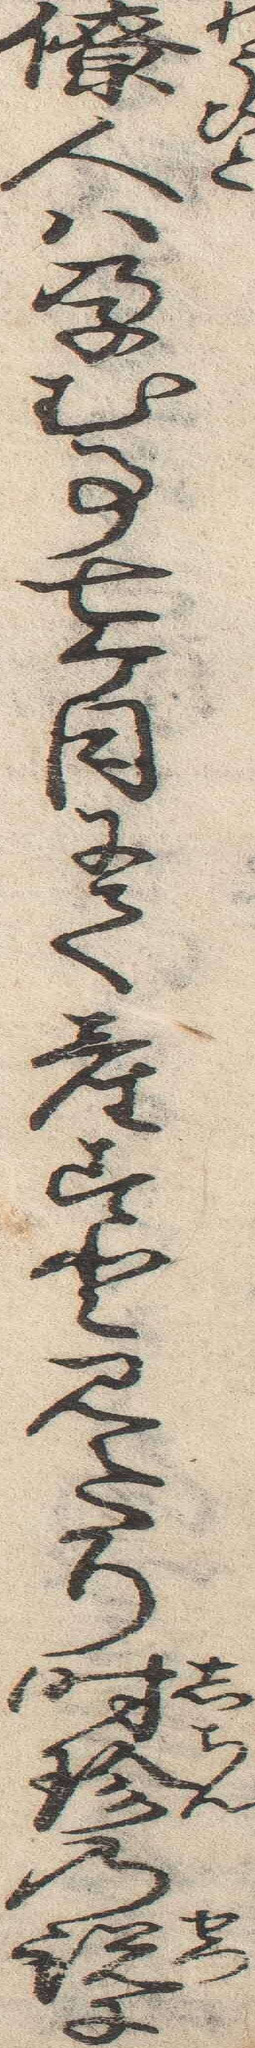僚人は孕む事七ヶ月にて産すと見えたり時珍の説に
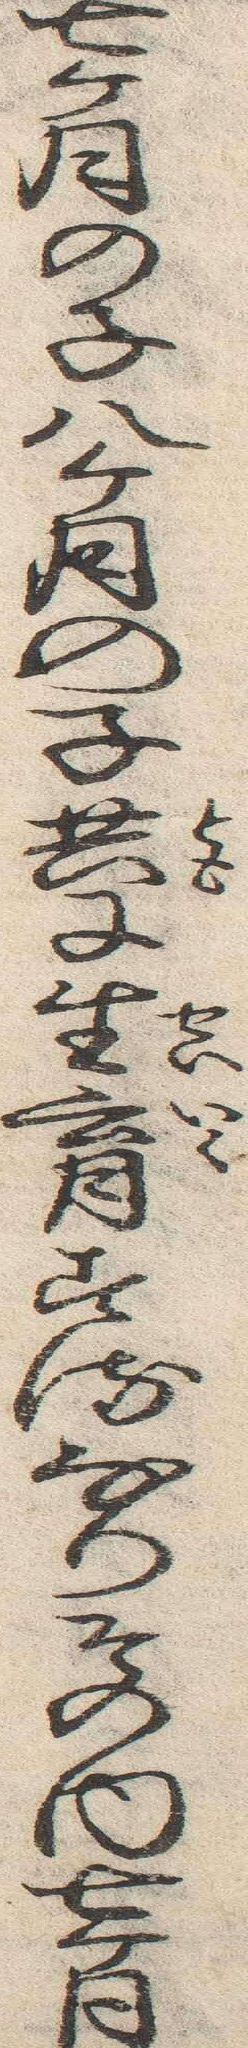七ヶ月の子八ヶ月の子共に生育するなりその内七ヶ月
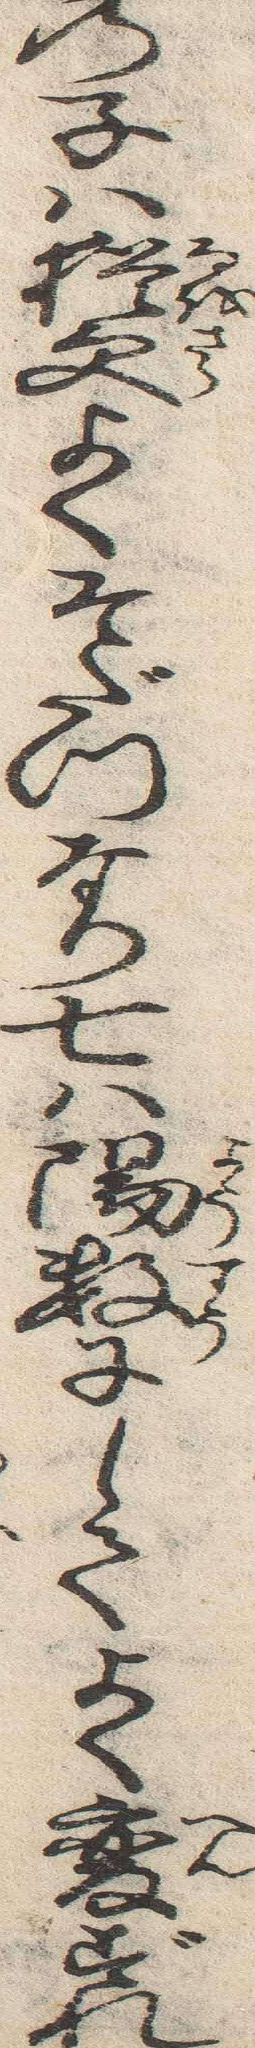の子は猶更よくそだつなり七は陽数にしてよく変ずれ
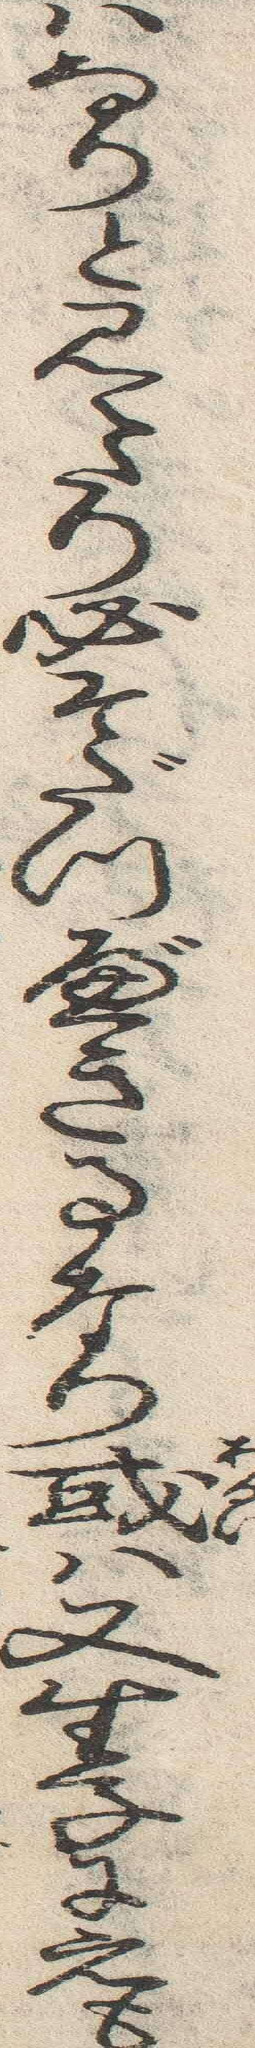はなりと見えたり必そだつべき事なり或は又生子に之も
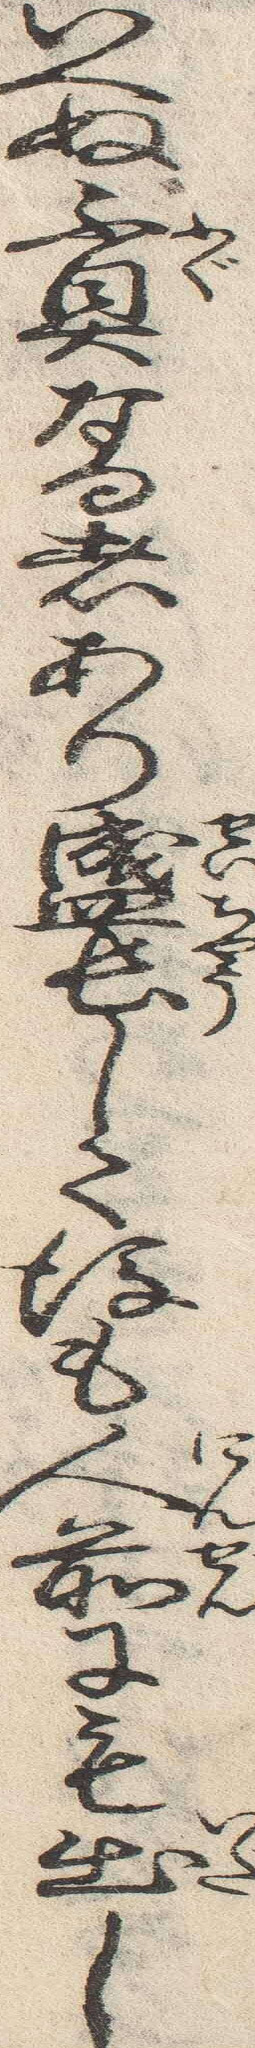いへぬ不具なる者あり盛長して後も人前にも出し
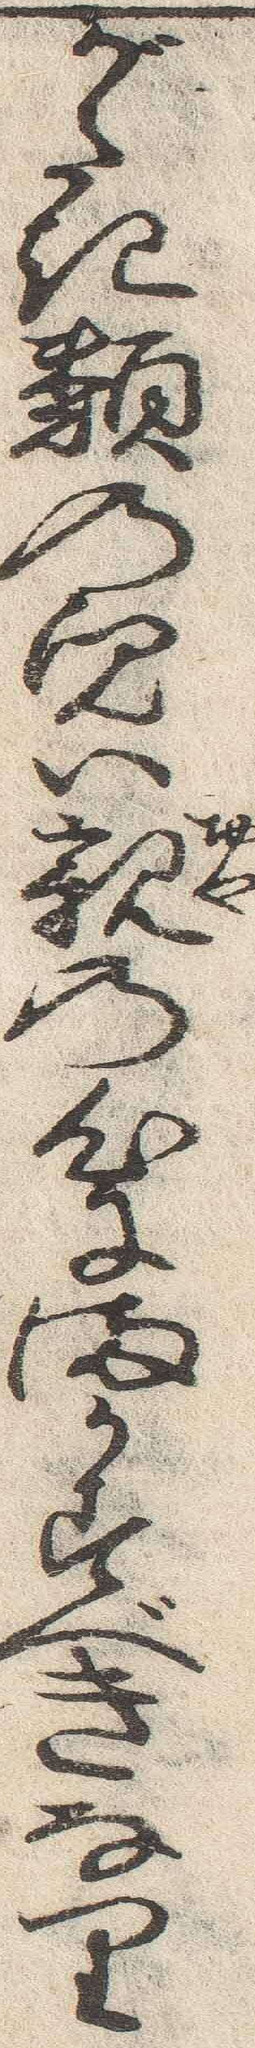がたき類の児は親の心にまかすべきなり
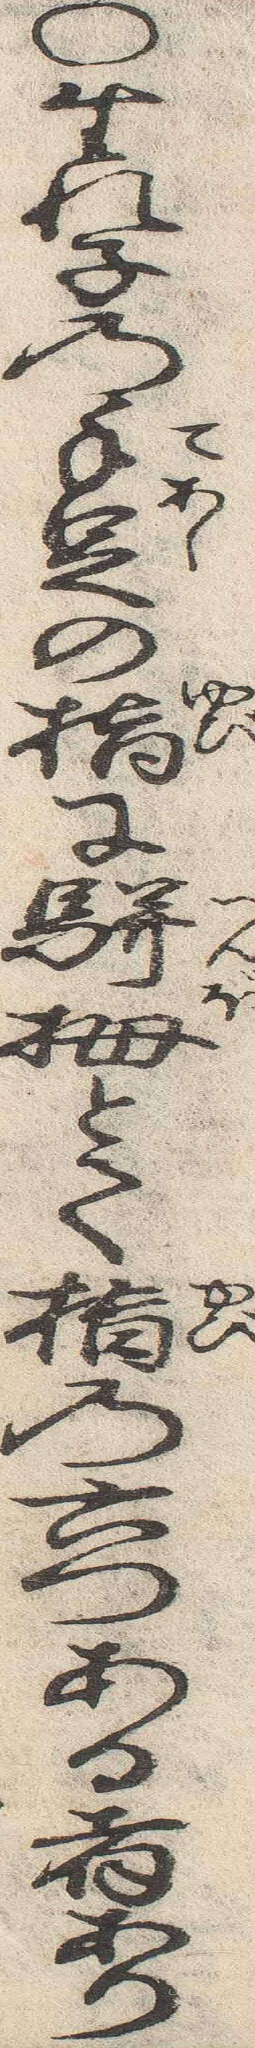◯生れ子の手足の指に駢拇とて指の六つある者あり
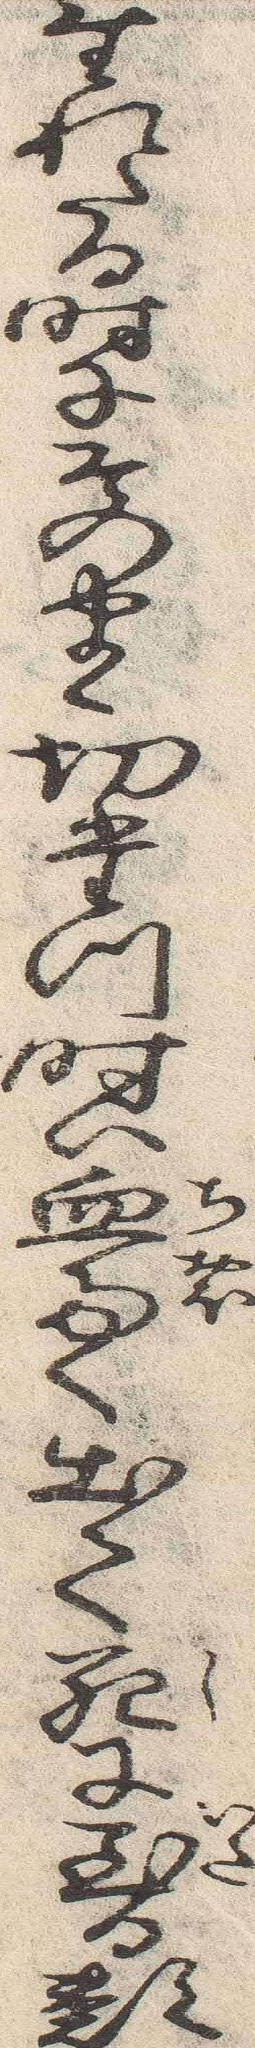生れたる時にそのまま切たつ時は血多く出て死に至る類
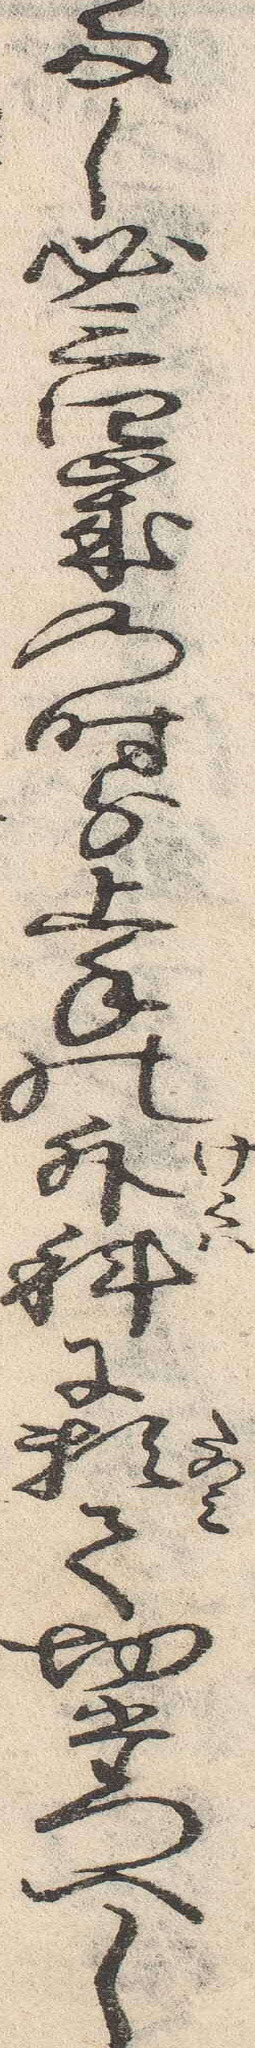多し必三四歳の時分上手の外科に頼て切たつへし
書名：小児必用養育草
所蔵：東京学芸大学附属図書館 国文学研究資料館
